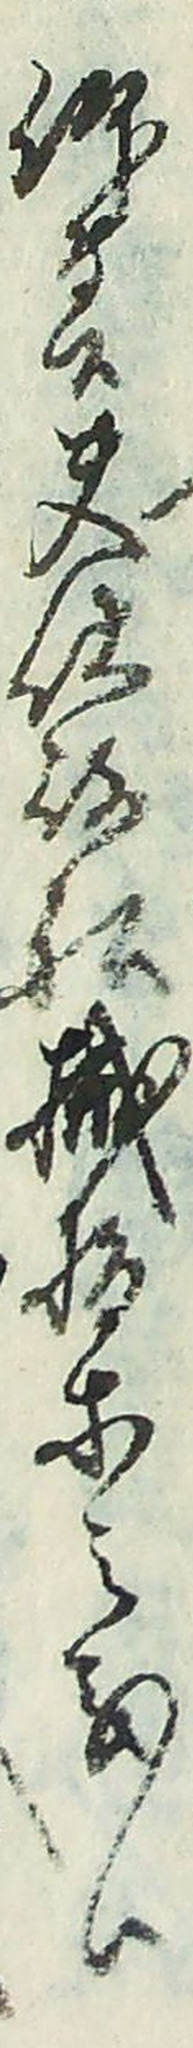仰付候夫仕役船械指等の義は
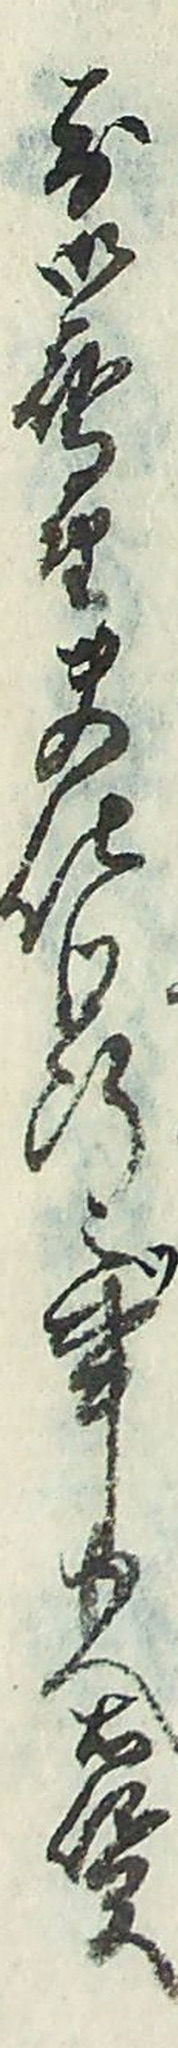前御鷹野夫仕同断の御事ゆへ右賃

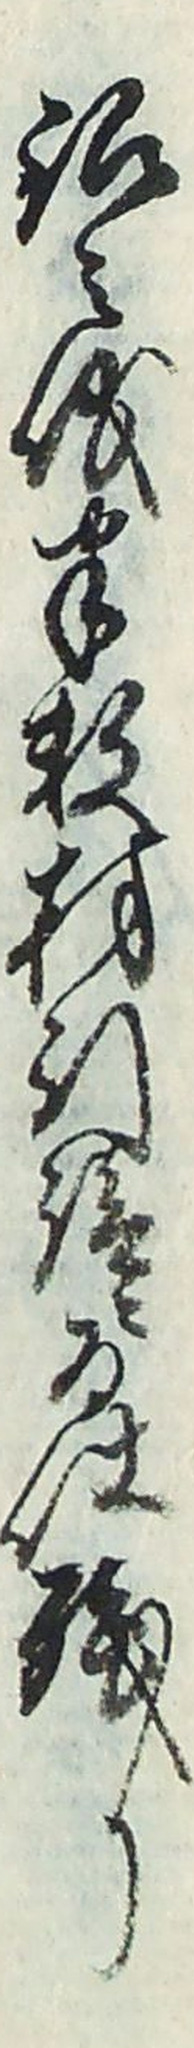銀の儀半数村引請にて仕残り
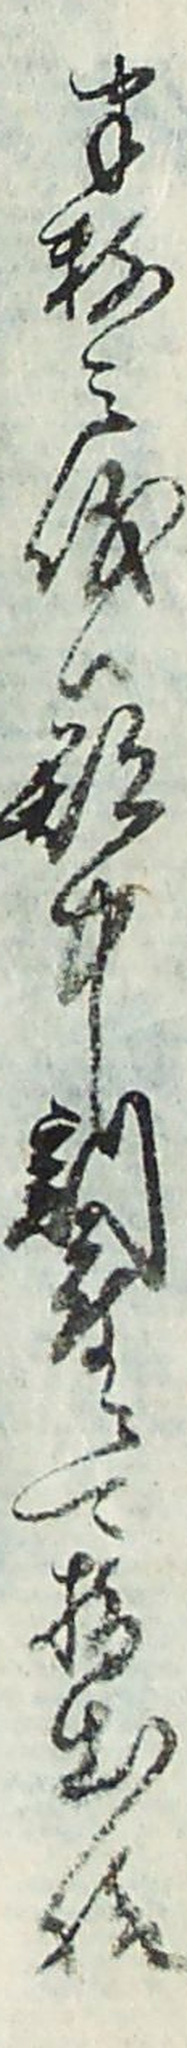半数の儀は郡中割符にて指出様
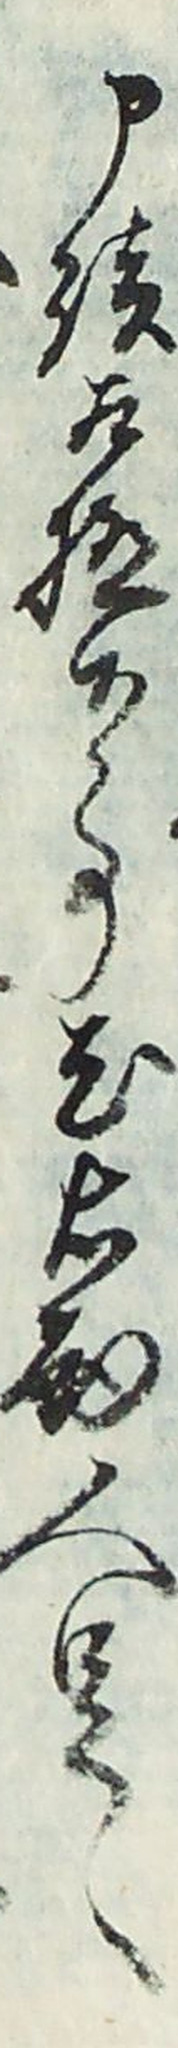申談相極候事尤右勤人足へ
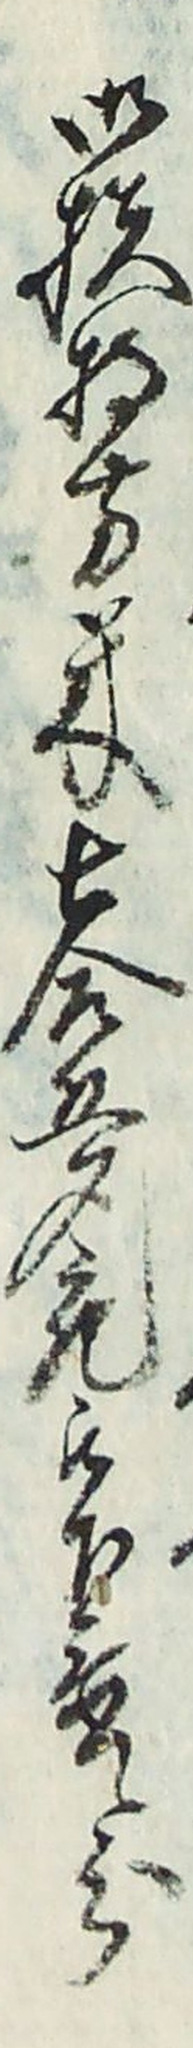御扶持方米七合五勺宛被下置候分
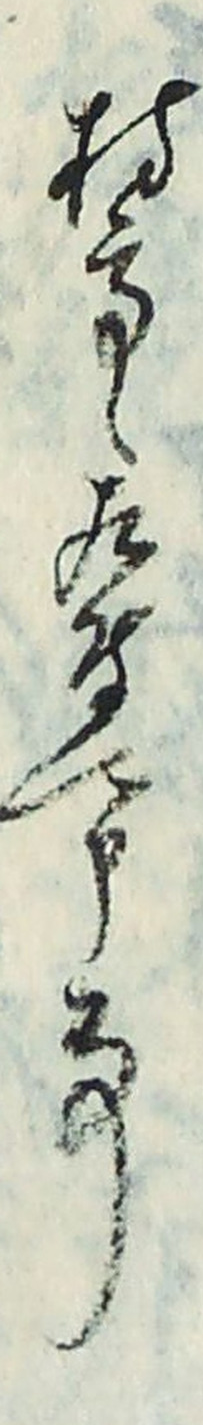村方へ相付可申事
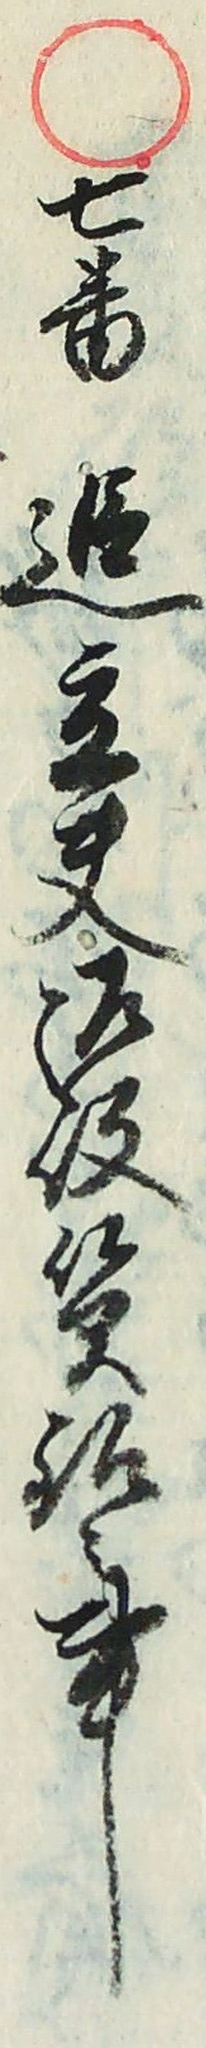七番追立夫御役賃銀之事
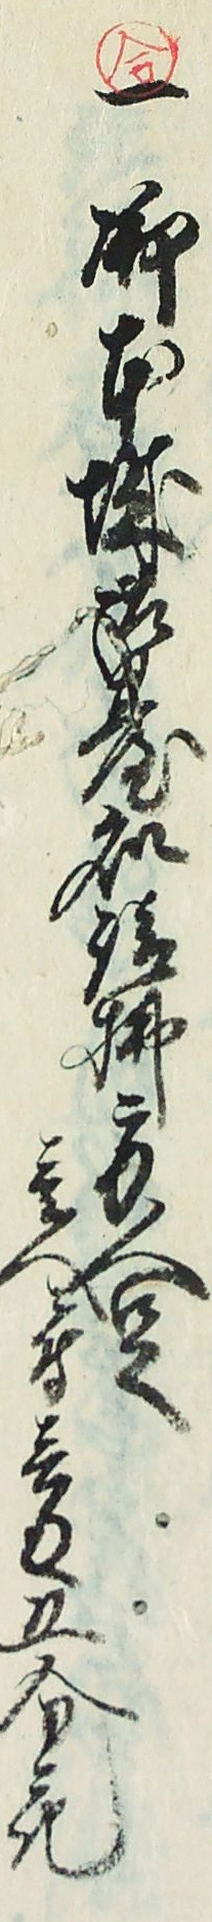一御本城御台処請払方人足一人に付一匁五分宛
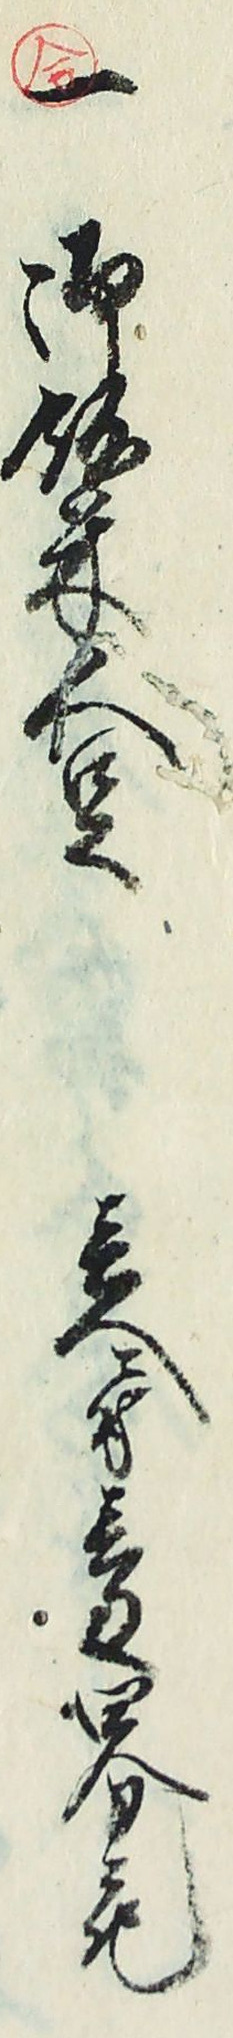一御飯米人足一人に付一匁四分宛
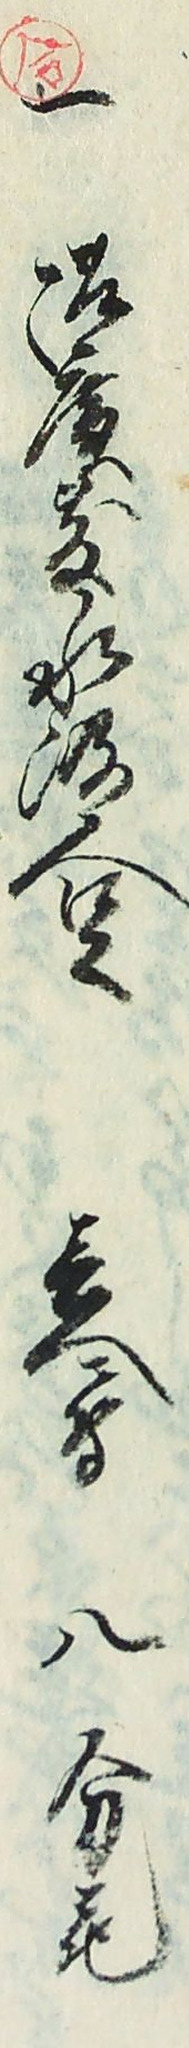一御広敷水汲人足一人に付八分宛
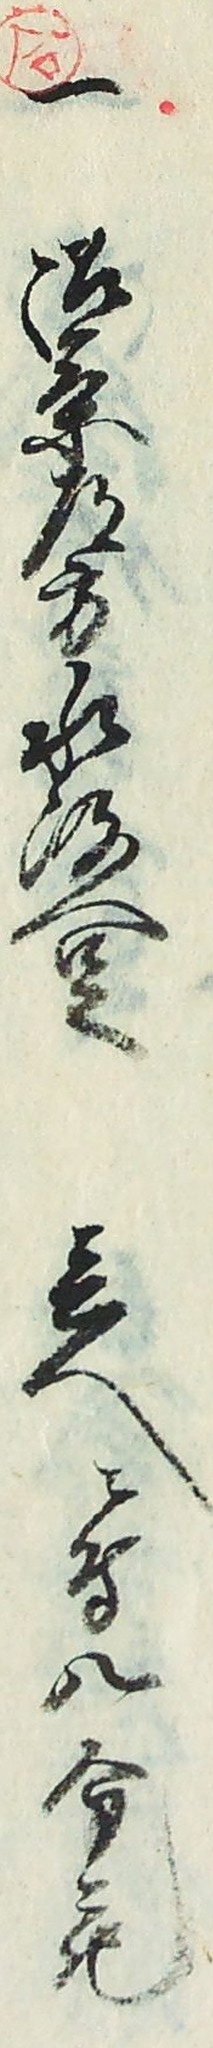一御茶道方水汲人足一人に付八分宛
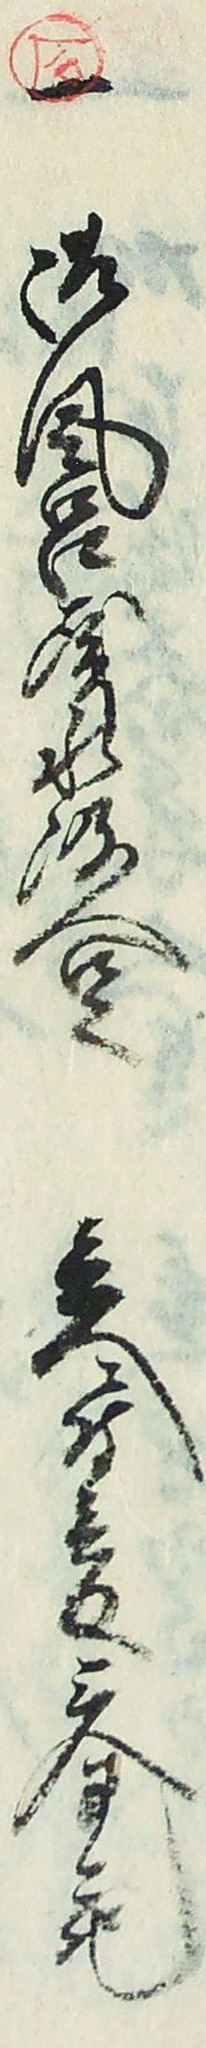一御風呂屋水汲人足一人に付一匁三分宛
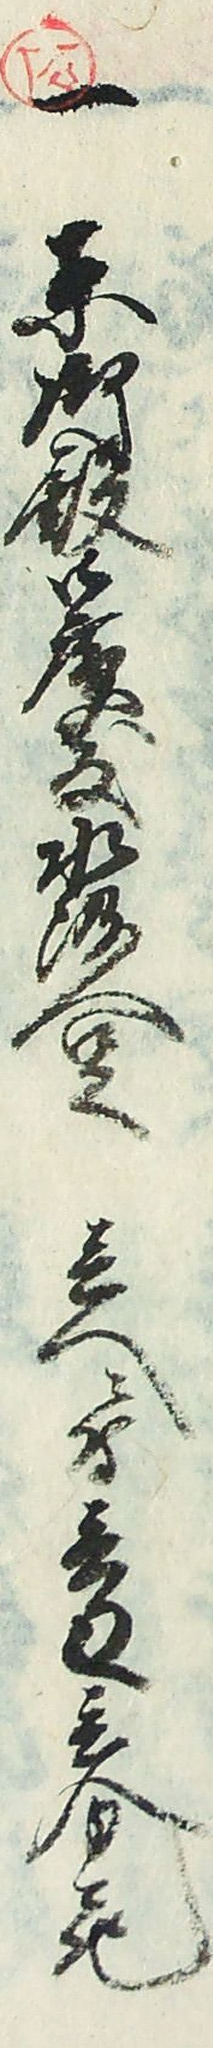一東御殿広敷水汲人足一人に付一匁三分宛

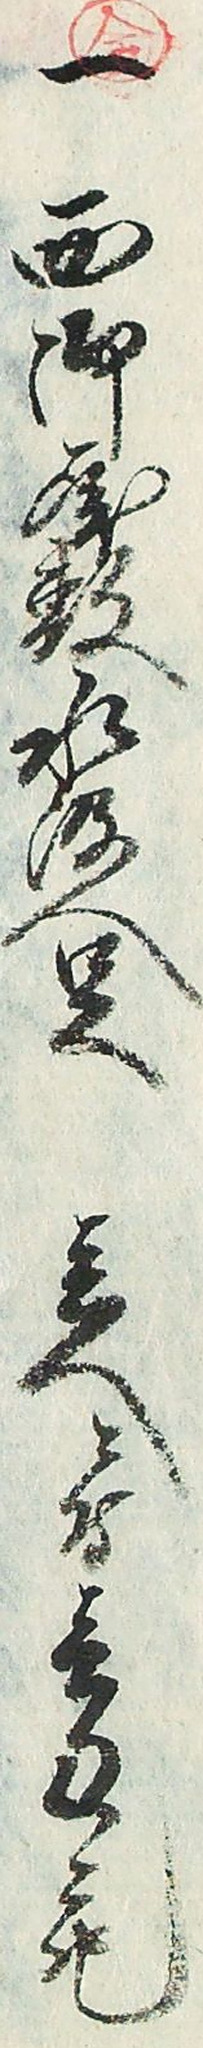一西御屋敷水汲人足一人に付一匁宛
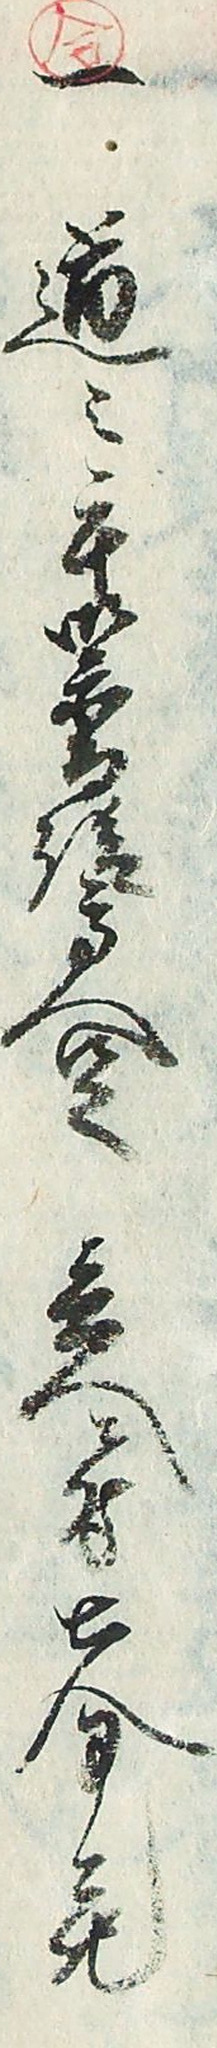一道の手御普請方人足一人に付七分宛
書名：諸割賦物賃銀定記録帳
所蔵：鳴門教育大学 Naruto University of Education
